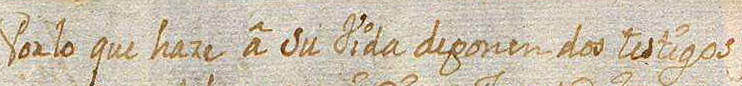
Por lo que haze â su Vida deponen dos testigos
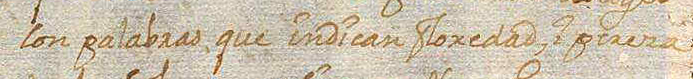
con palabras que indican floxedad, i pereza
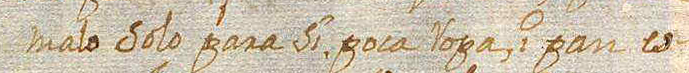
malo Solo para Si, poca Ropa, i pan es
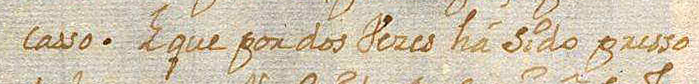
casso. Y que por dos Vezes há sido presso
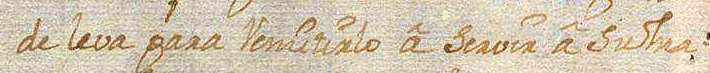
de leva para Remitirlo â Servir â Su Ma
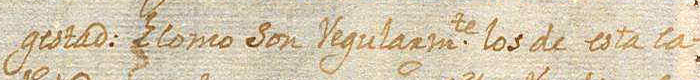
gestad: Y como Son Regularm.te los de esta ca
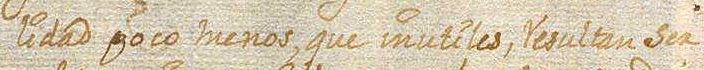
lidad poco menos, que inutiles, Resultan ser
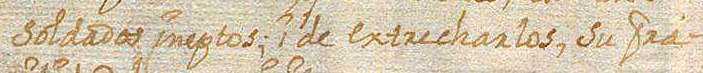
Soldados ineptos; i de Extrecharlos, Su fra
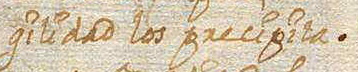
gilidad los precepita.
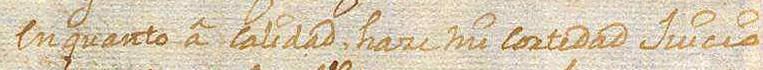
Enquanto â calidad haze mi cortedad Iuicio
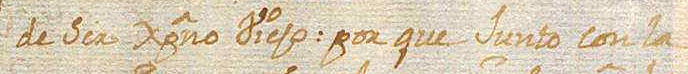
de Ser Xpn̄o Viejo: por que Iunto con la
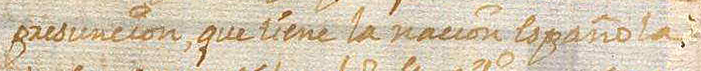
presuncion, que tiene la nacion Española
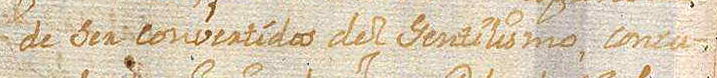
de Ser convertidos del Gentilismo, concu
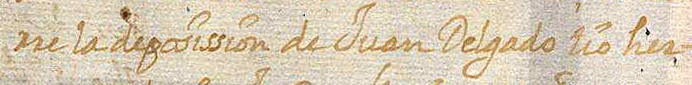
rre la deposission de Iuan Delgado tio her
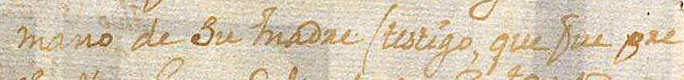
mano de Su Madre (testigo, que fue pre
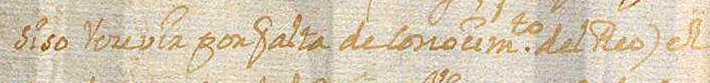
siso Rezevir por falta de conocim.to del Reo) el
